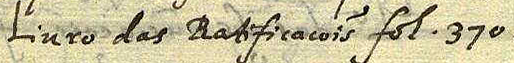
Liuro das Ratificacois̄ fol. 370
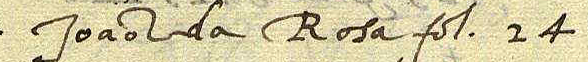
Joaõ da Rosa fol. 24
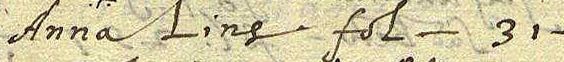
Anna Lins . fol — 31 -
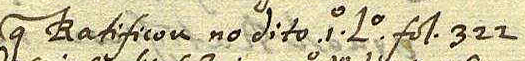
q̄ Ratificou no dito .1o. Lo. fol. 322
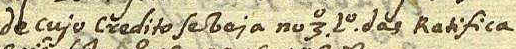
de cujo credito se veja no 3o. Lo. das Ratifica
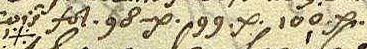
çois̄ fol. 98 - ꝟ. 99. ꝟ. 100. ꝟ.
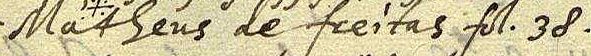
Matheus de freitas fol. 38.
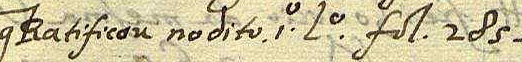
q̄ Ratificou no dito. 1o. Lo. fol. 285 -
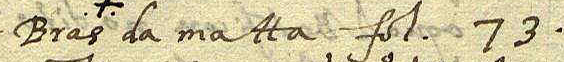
Bras da matta fol. 73.
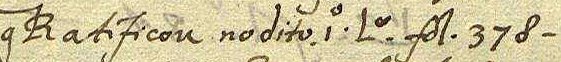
q̄ Ratificou no dito .1o. Lo. fol. 378 -
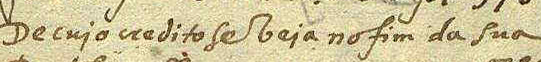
De cujo credito se veja no fim da sua
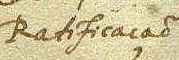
Ratificaçaõ
